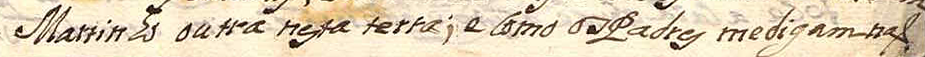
Martinho outra nesta terra; e Como os Padres me digam naõ
